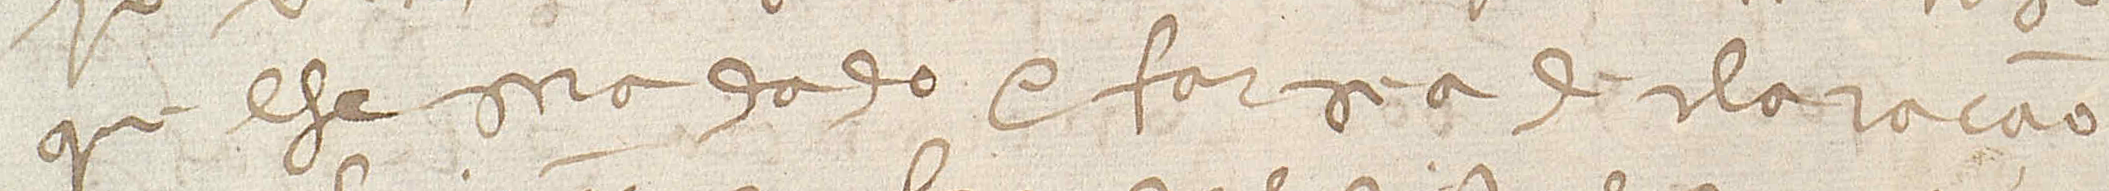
que lhe sera dado e farsea declaração
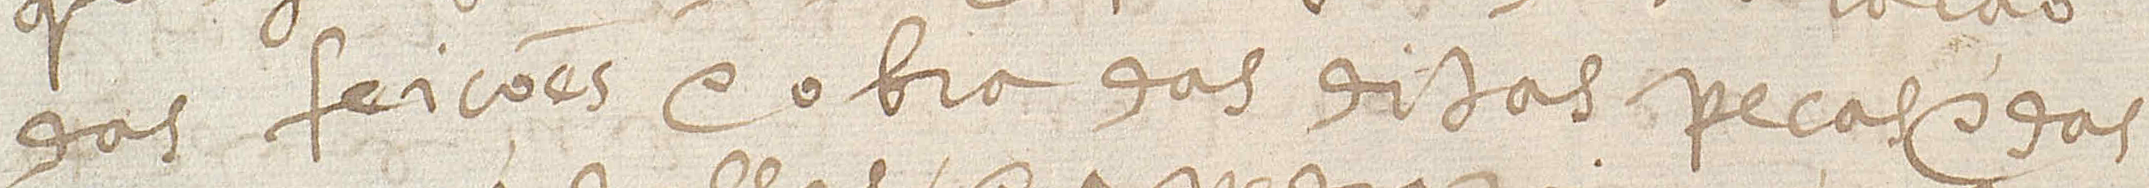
das feições e obra das ditas peças e das
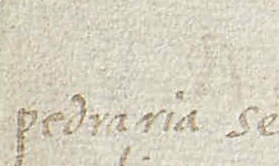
pedraria se
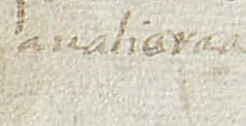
aualiaraa
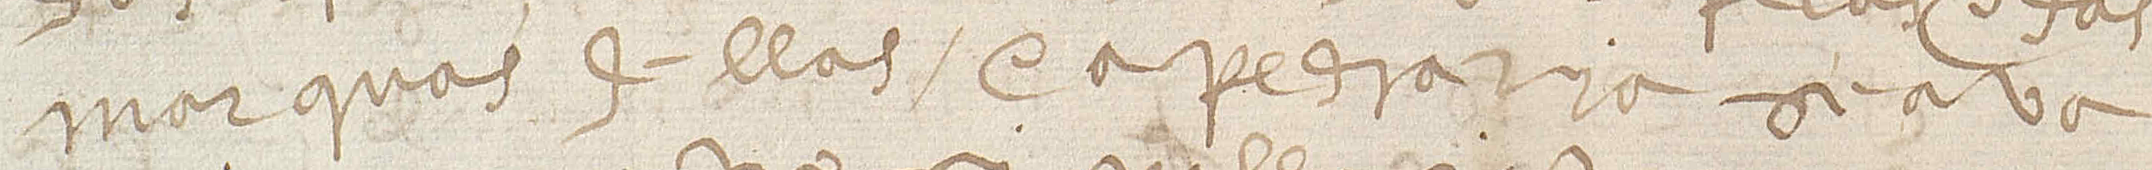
marquas dellas / e a pedraria se ava
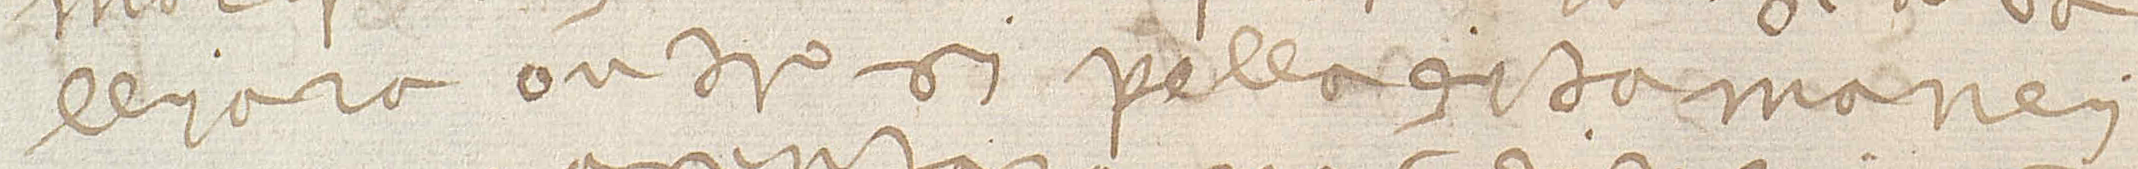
llyara outrosy pella dita maney
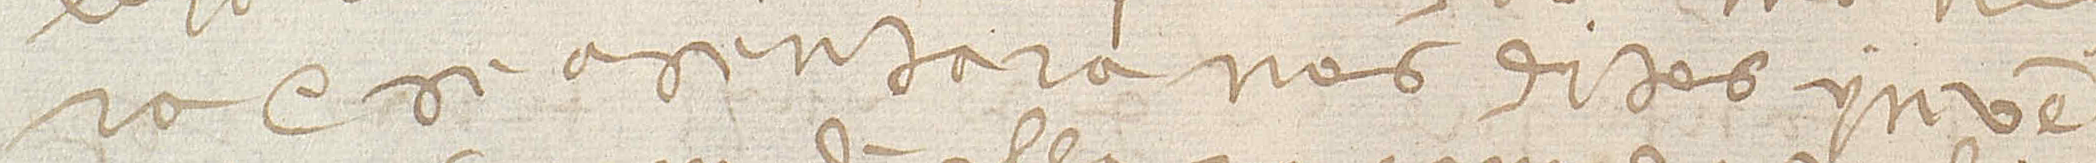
ra e se asentara nos dytos ynvē
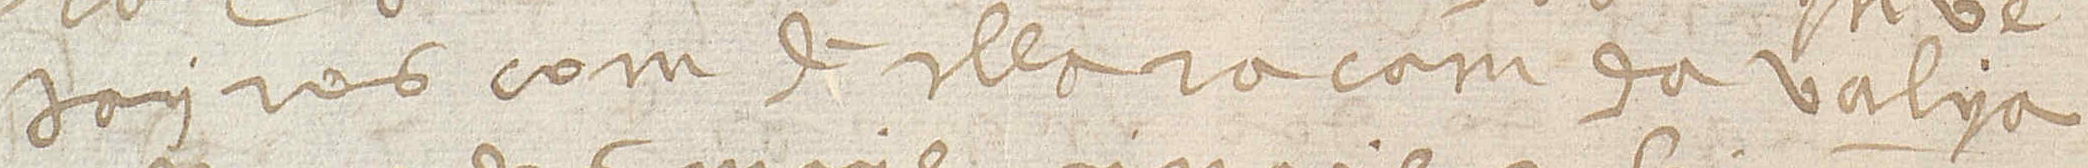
tayros com decllaraçam da valya
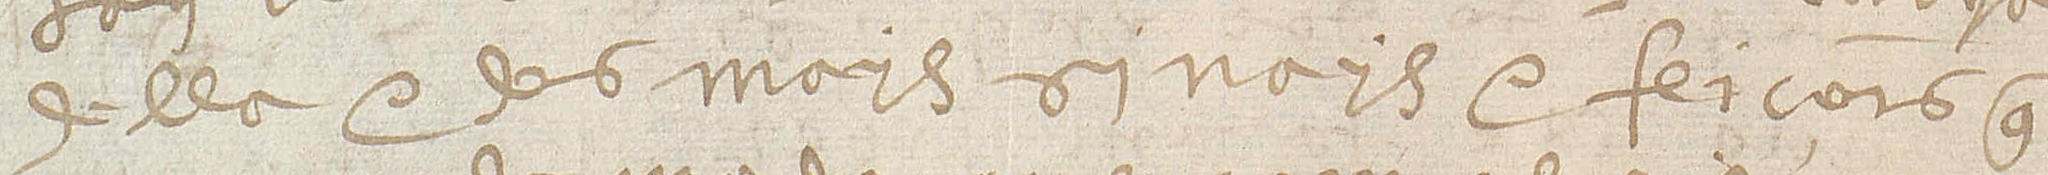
della e dos mays synays e feições q̄
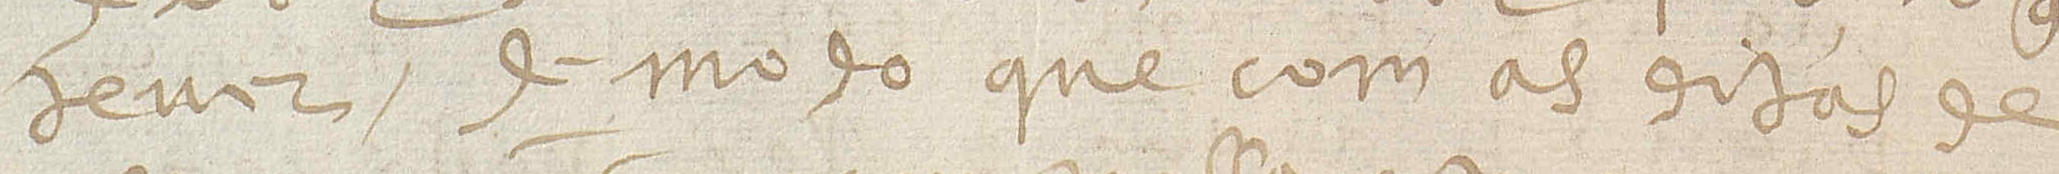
teuer / de modo que com as ditas de
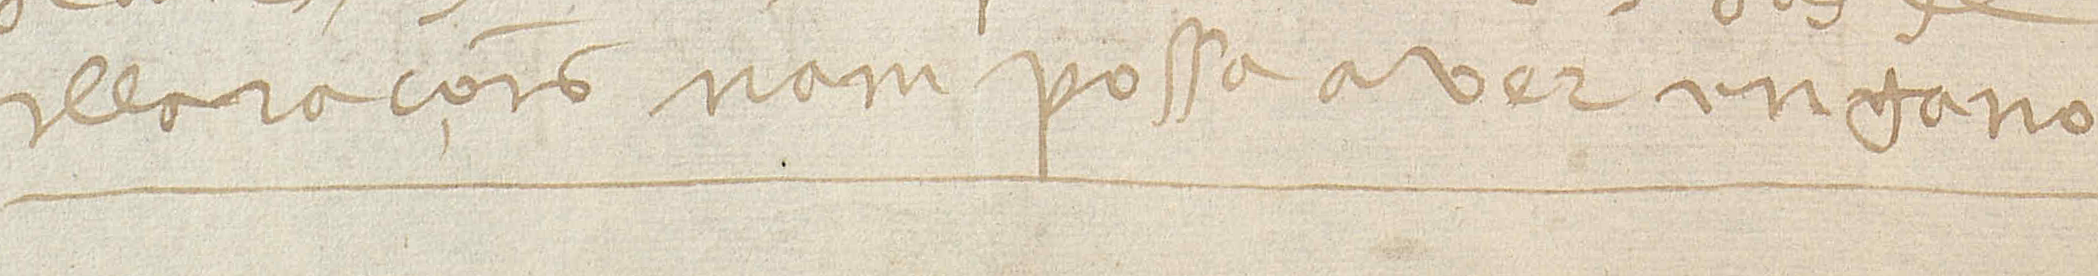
cllarações nam possa aver engano
